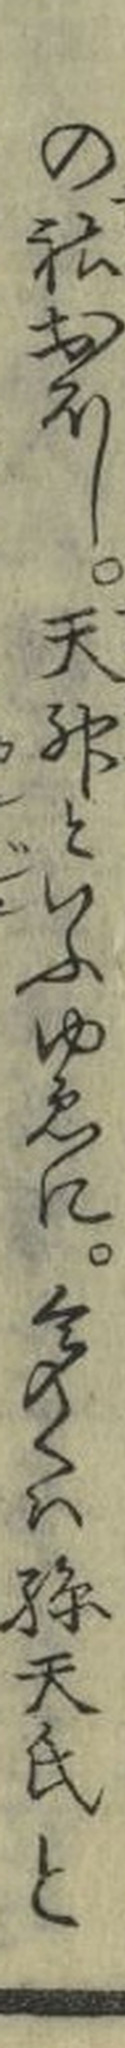の社おほし。天神といふゆゑに。多くは孫天氏と
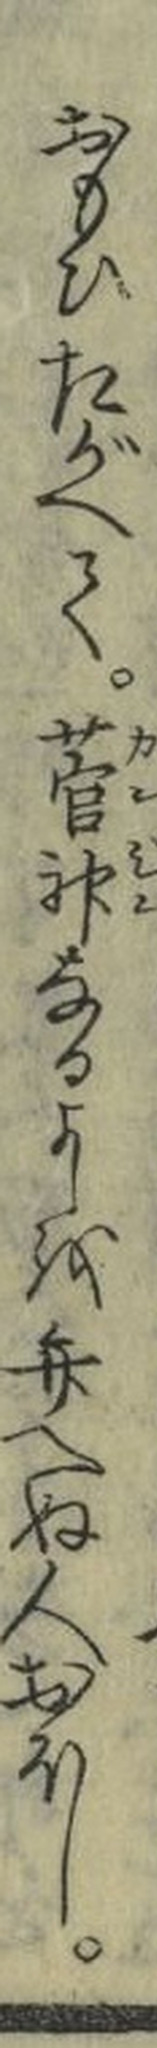おもひたがへて。菅神なるよしを弁へぬ人おほし。
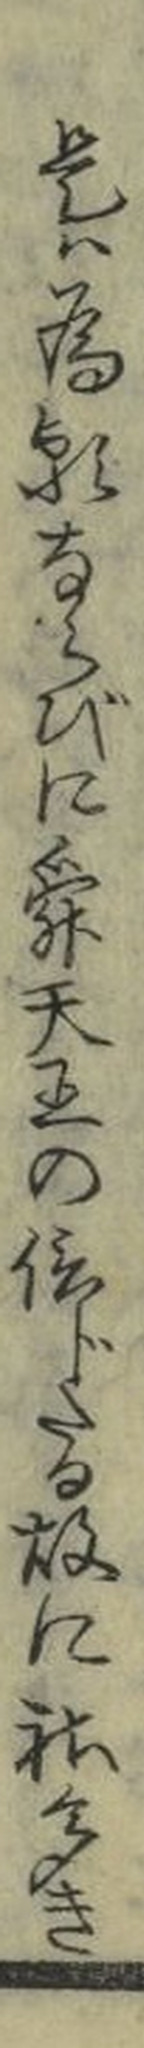是は為朝ならびに舜天王の信じたる故に社多き
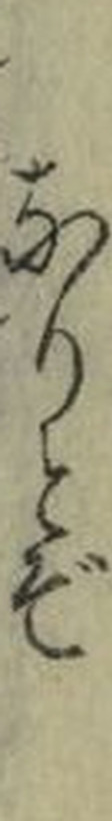なりとぞ
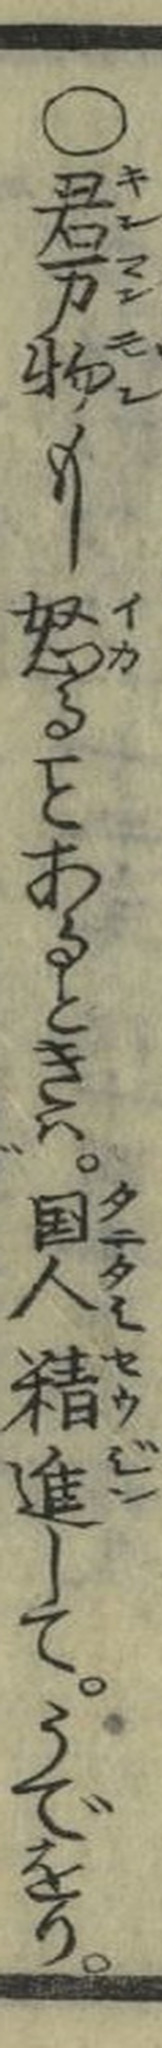○君万物も怒ることあるときは。国人精進して。うでをり。
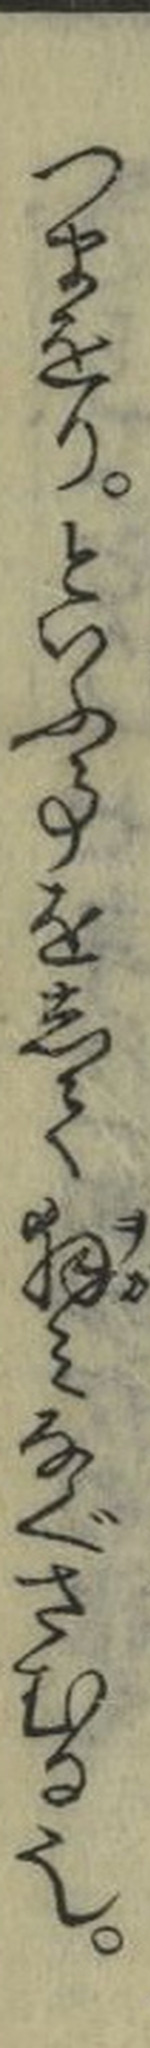つまをり。といふ事をして拝みなぐさむる也。

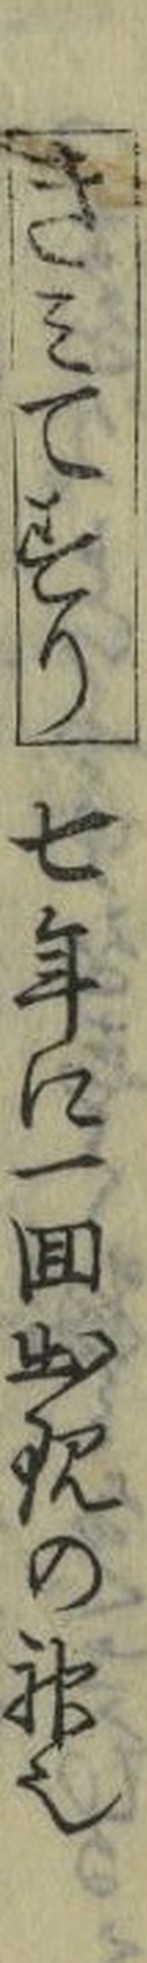「きみてすり」七年に一回出現の神也
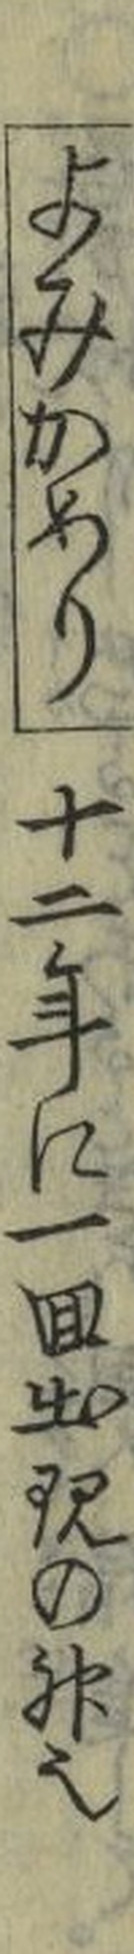「よみかめり」十二年に一回出現の神也
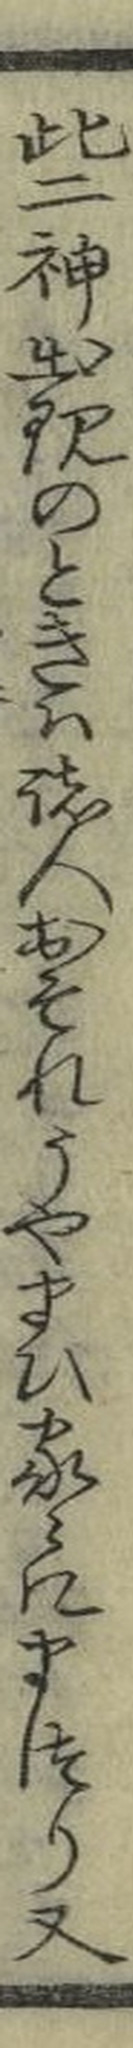此二神出現のときは諸人おそれうやまひ家々にまつり又
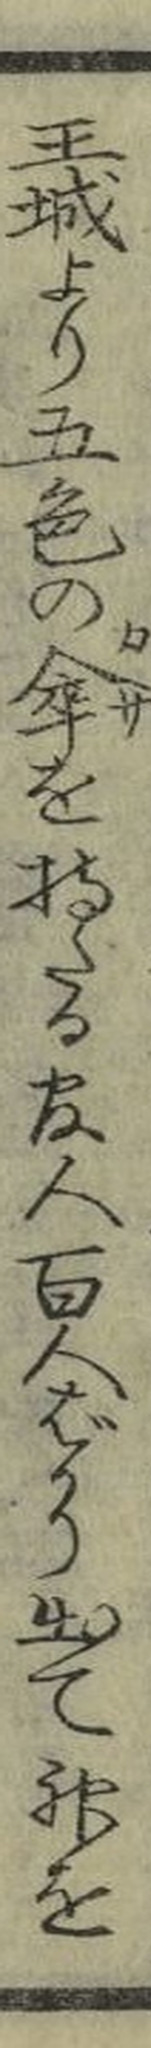玉城より五色の傘を持たる官人百人ばかり出て神を
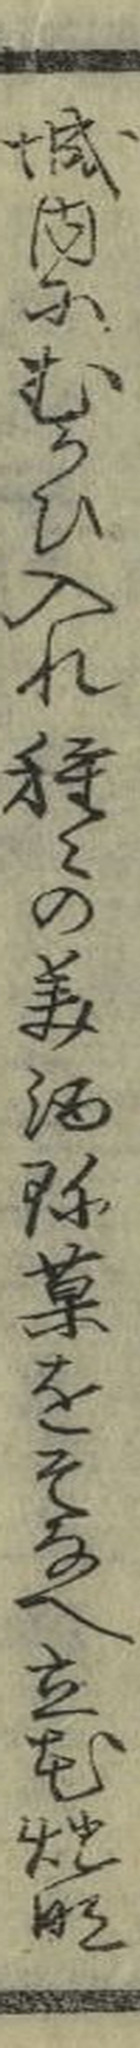城内にむかひ入れ種々の美酒珍菓をそなへ立花灯明
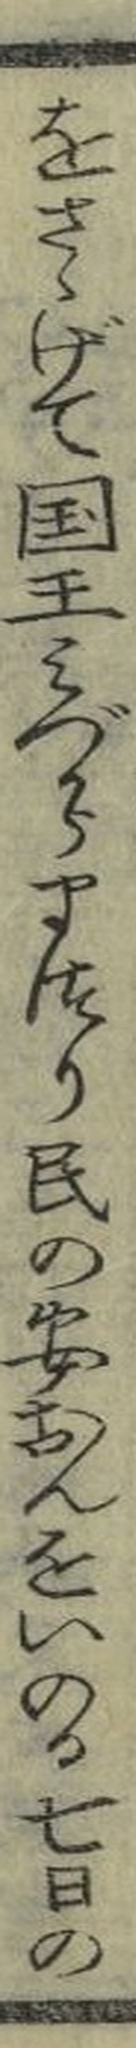をさゝげて国王みづからまつり民の安おんをいのる七日の
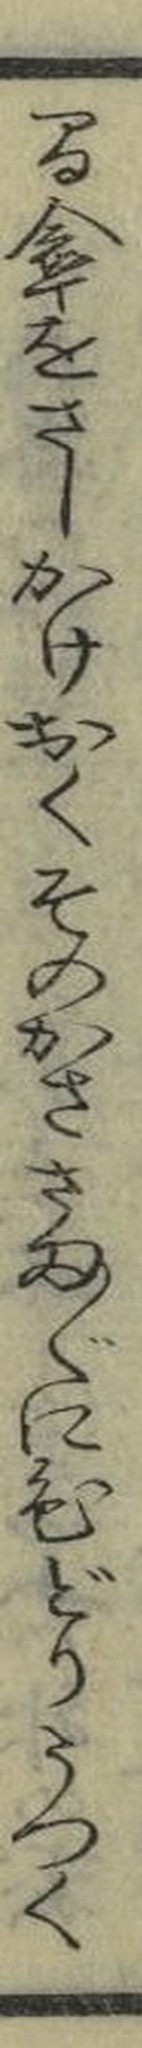間傘をさしかけおくそのかささま〴〵に色どりうつく
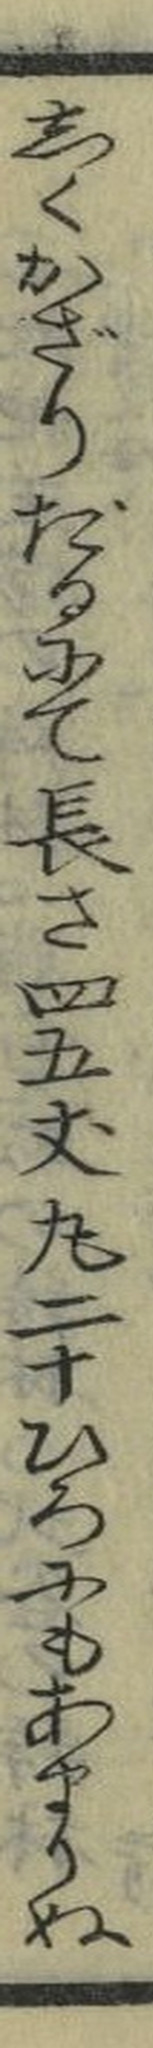しくかざりたるにて長さ四五丈丸二十ひろにもあまりぬ
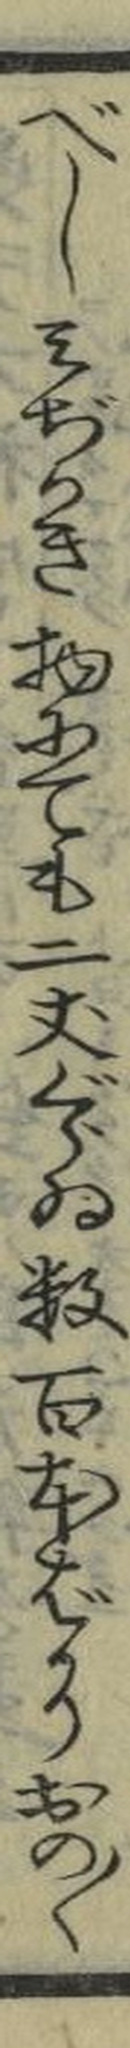べしみぢかき物にても二丈ぐらゐ数百本ばかりおの〳〵
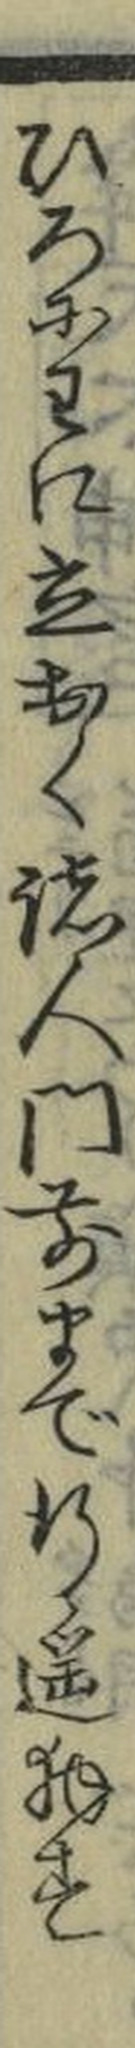ひろにわに立おく諸人門前まで行遥拝す
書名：琉球奇譚
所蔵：University of the Ryukyus Library
